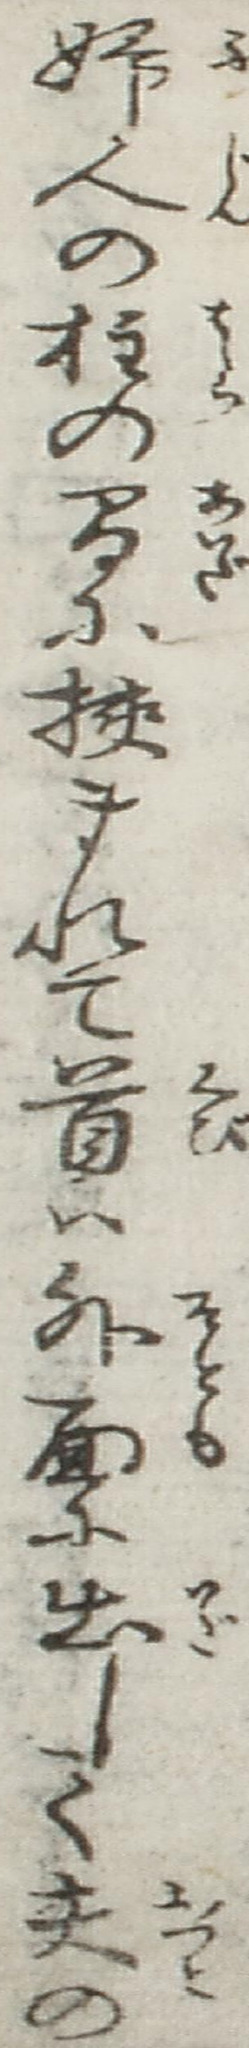婦人の柱の間に挟まれて首は外面に出して夫の
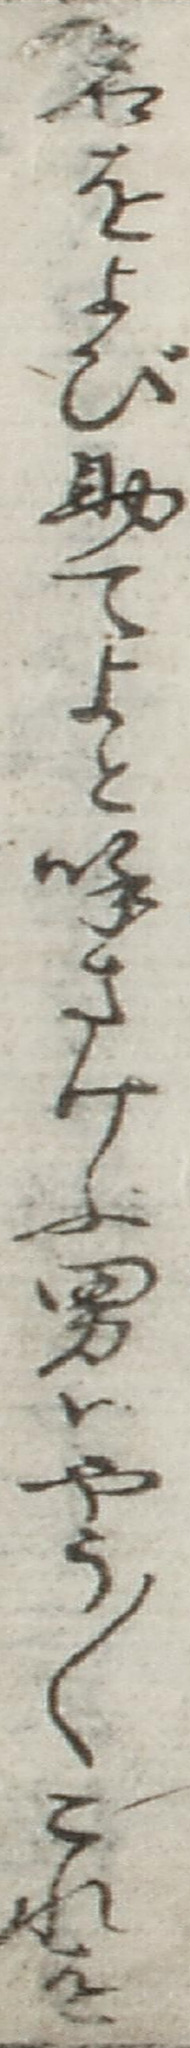名をよび助てよと呼さけふ男はやう〳〵これを

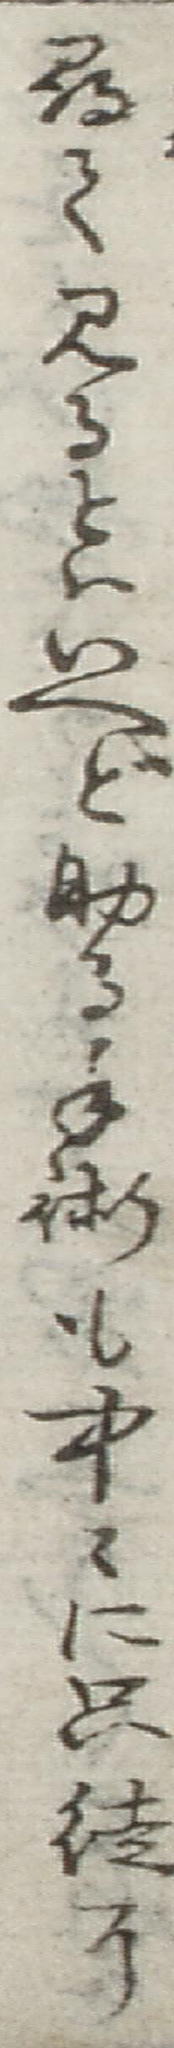尋て見るとはいへど助る手術も中〻に只徒に
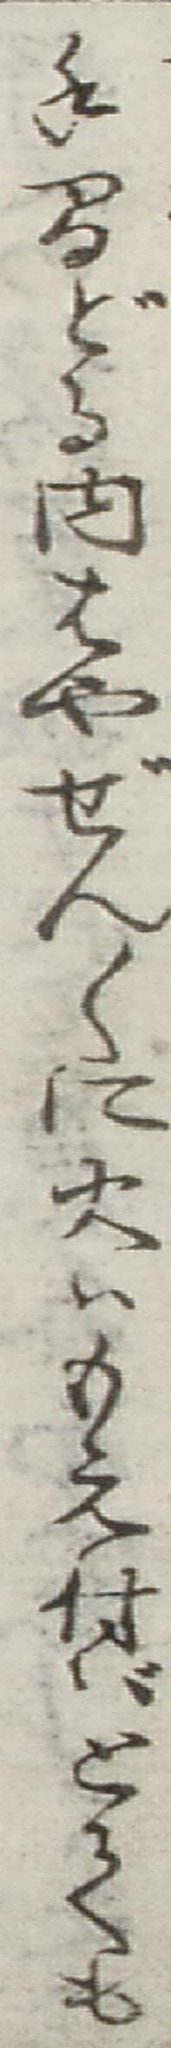手間どる内はやぜん〳〵に火はもえ付ばとても
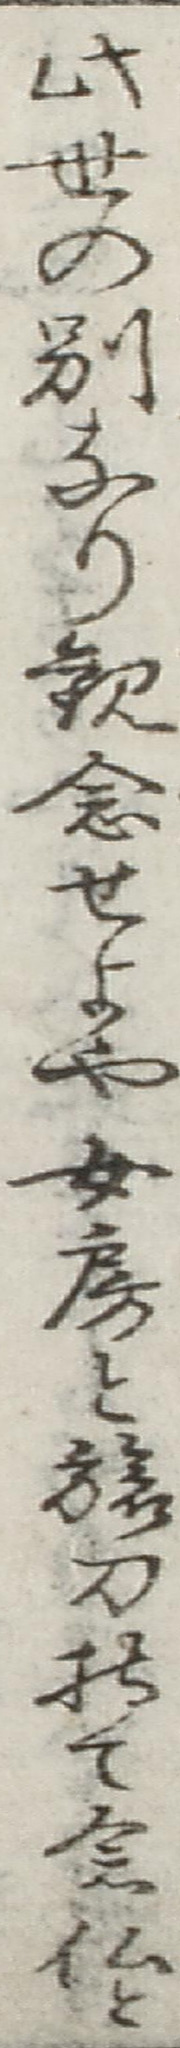此世の別なり観念せよや女房と旅刀持て念仏と
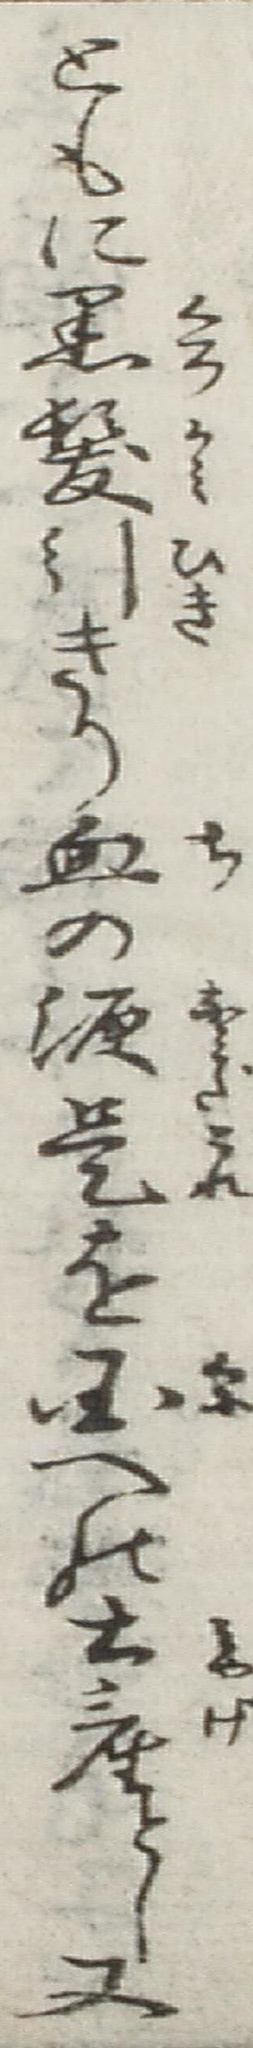ともに黒髪引きり血の涙是を国への土産とし又
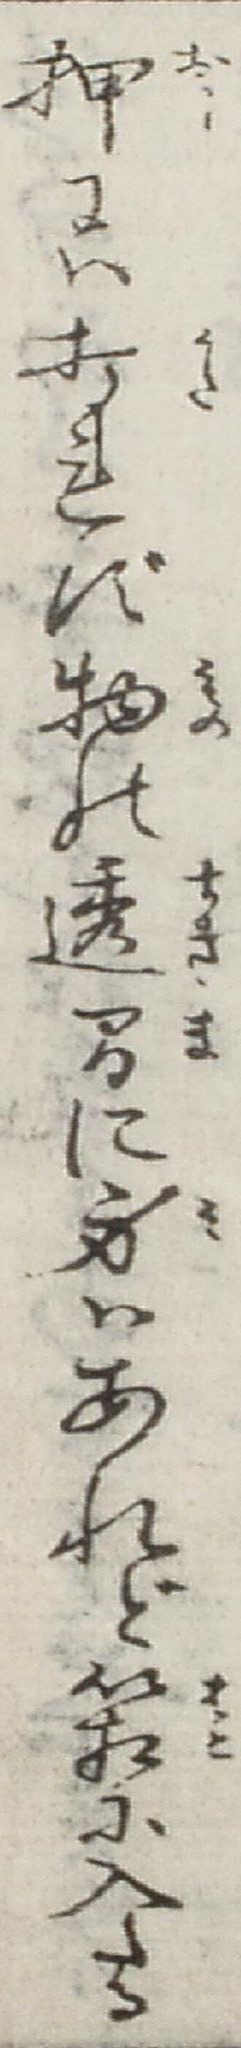押には打れず物の透間に身はあれど箱に入たる
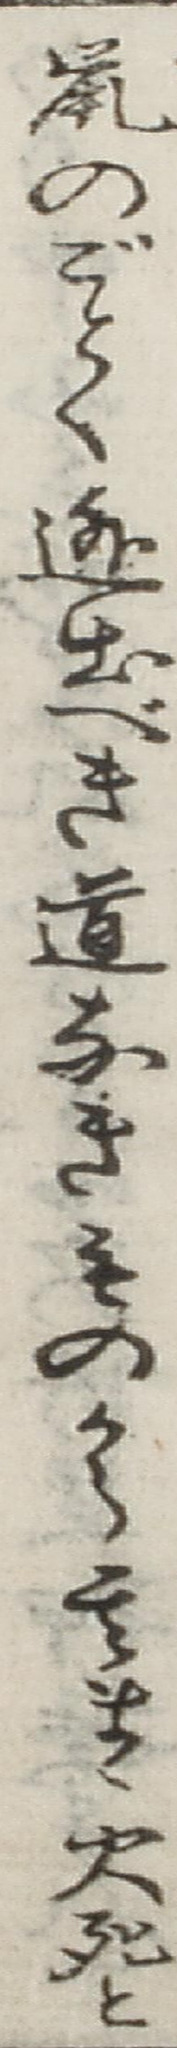鼠のごとく逃出べき道なきものから其まゝ火死と
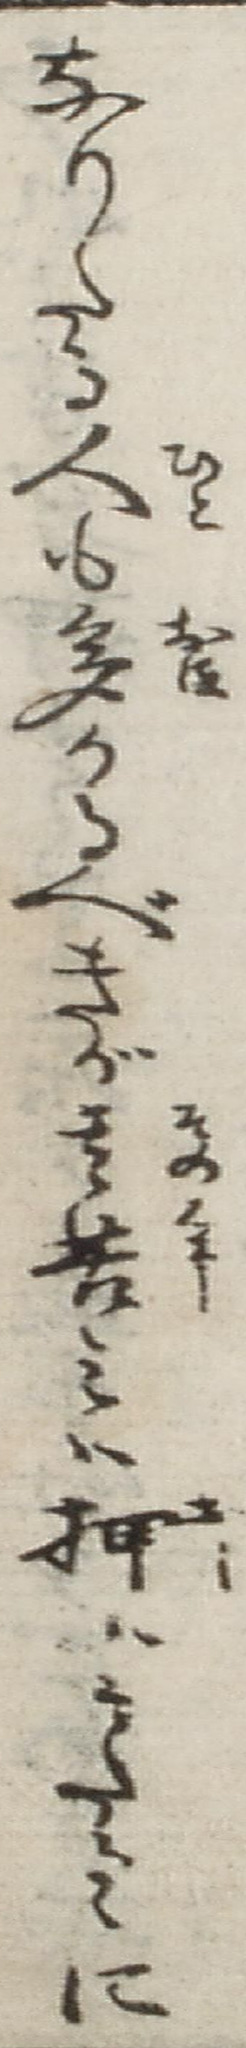なりたる人も多かるべきが其苦みは押はかたるゝに
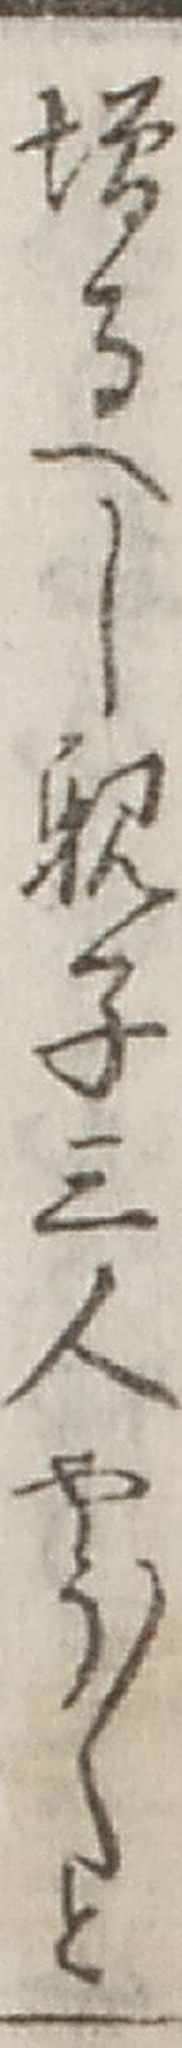増るへし親子三人やう〳〵と
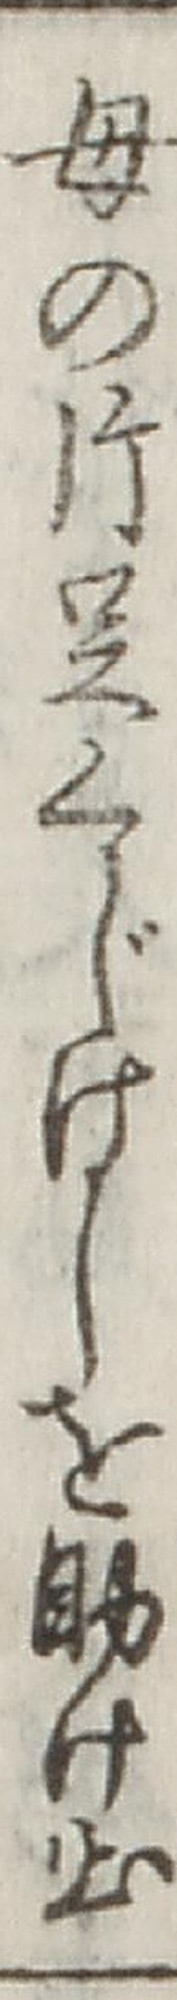母の片足くじけしを助け出
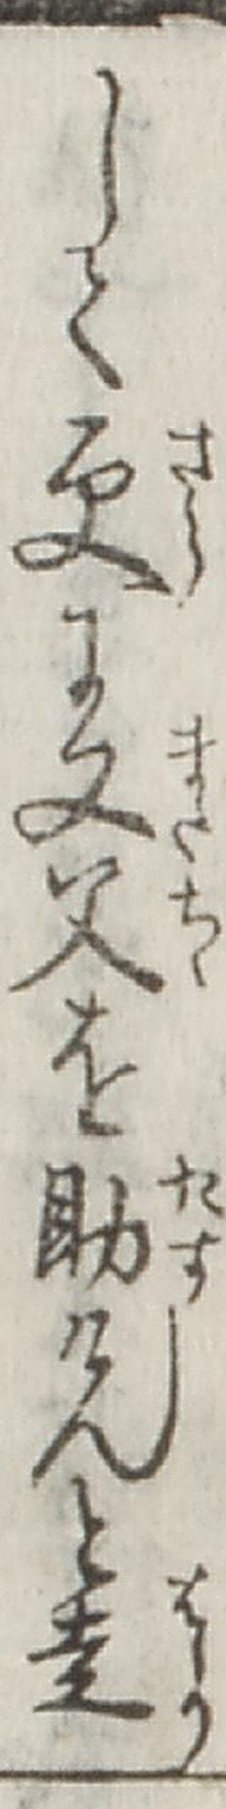して更に又父を助けんと走
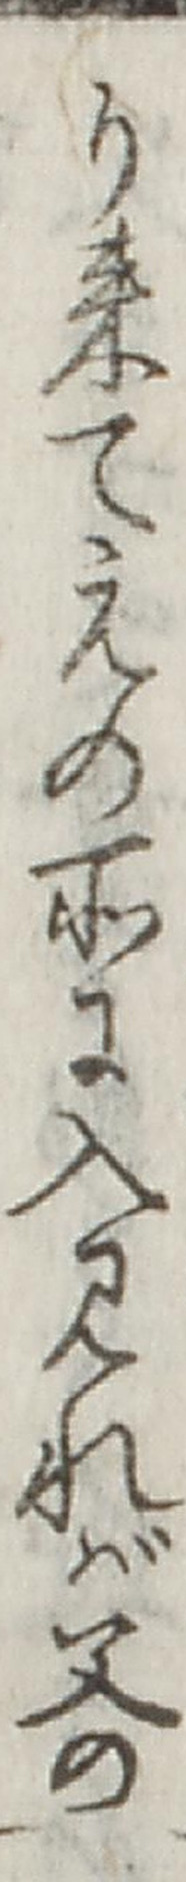り来て元の所に入見れば父の
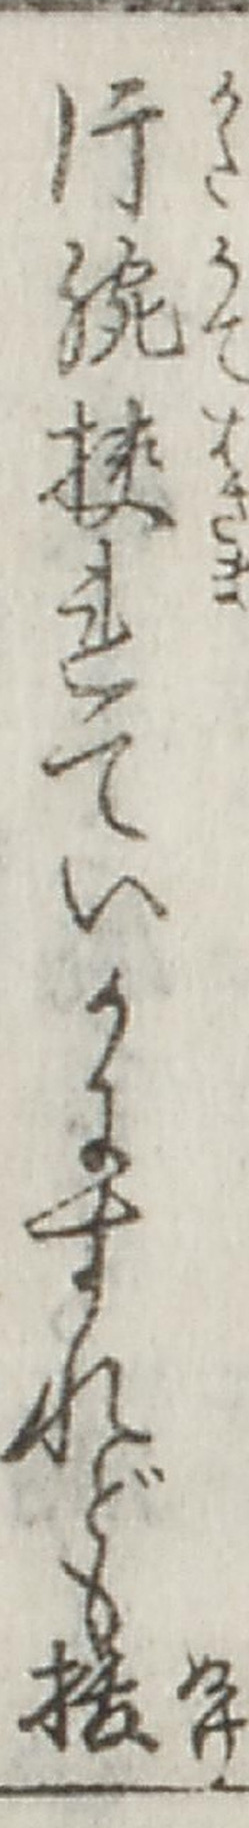片腕挟れていかにすれども抜
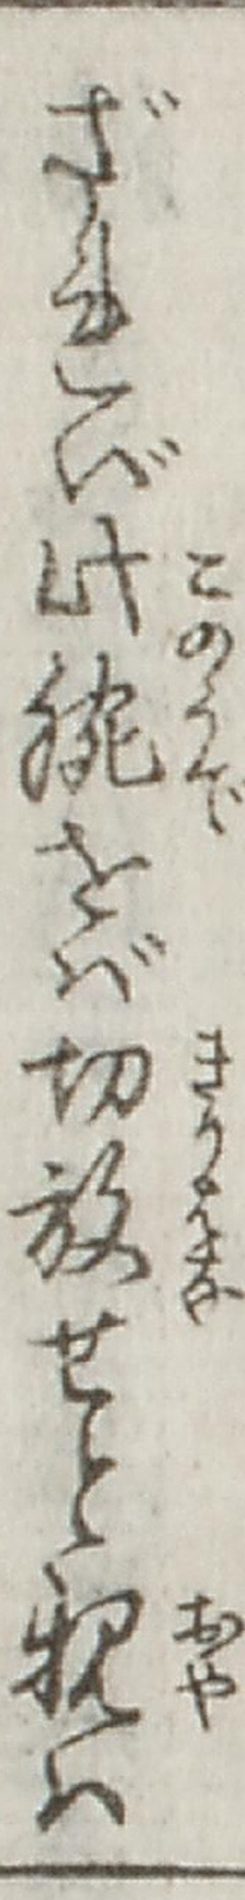ざれば此腕をば切放せと親は
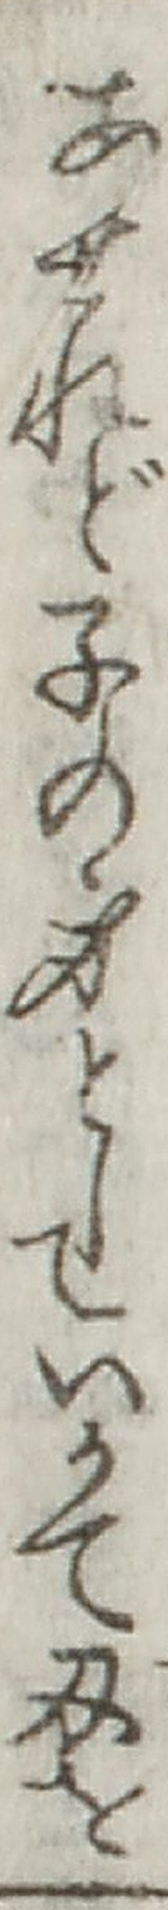あせれど子の身としていかて刃を
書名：地震世直草紙　全
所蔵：東京大学地震研究所図書室 Earthquake Research Institute Library, The University of Tokyo, JAPAN
